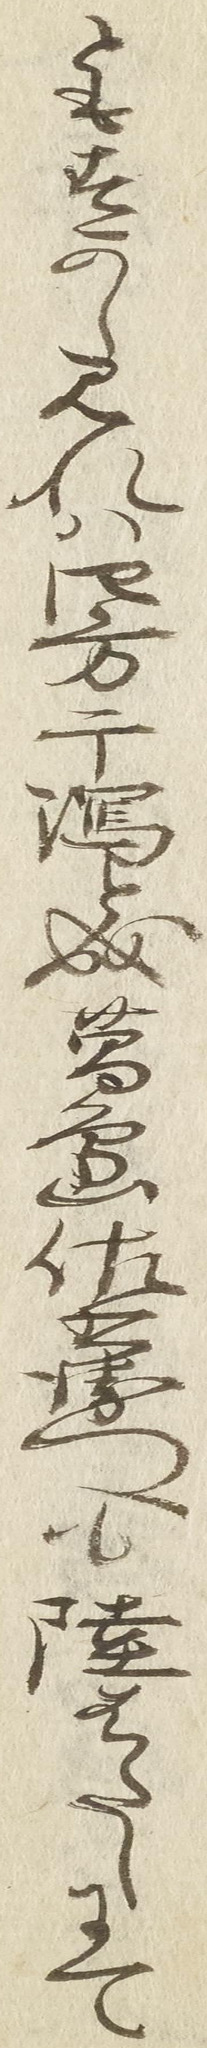ともすかし見れは四方干潟と成葛島佐右衛門へも陸わたしにて
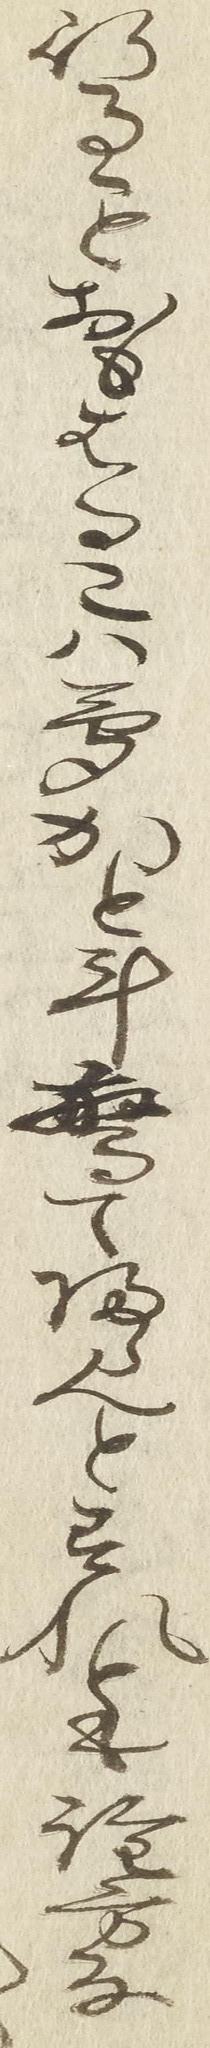行るゝとおもわるこは夢かと斗驚て帰らんとすれとも詮方なく
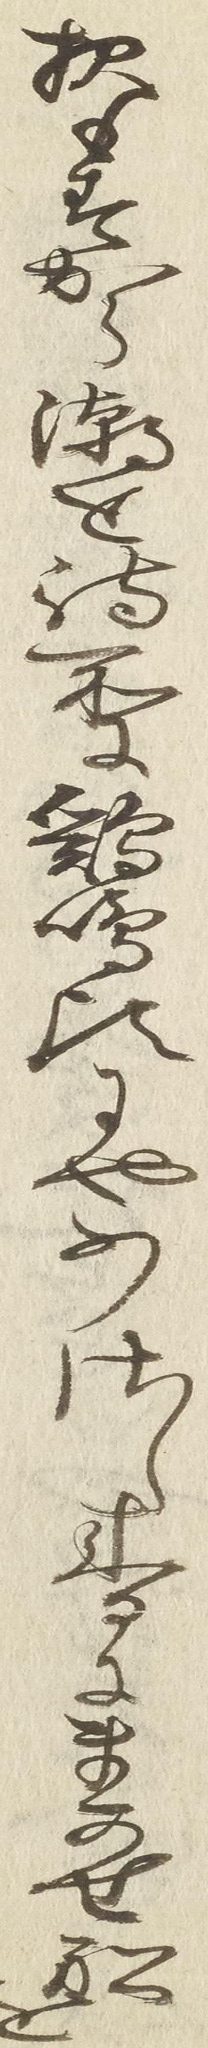夜もすから潮を待所に鶏鳴頃にや少さし来るにまかせ船を
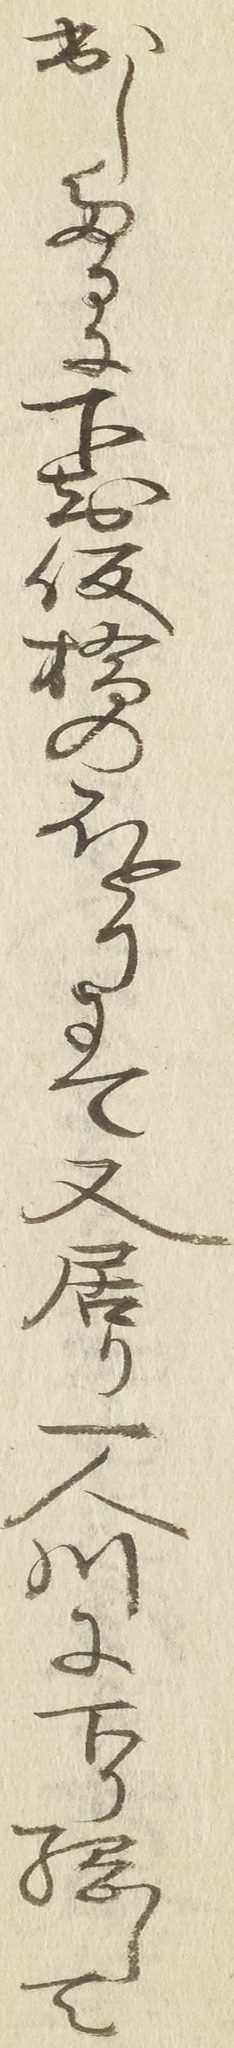出したるに下知仮橋のほとりにて又居り一人川に下り綱して
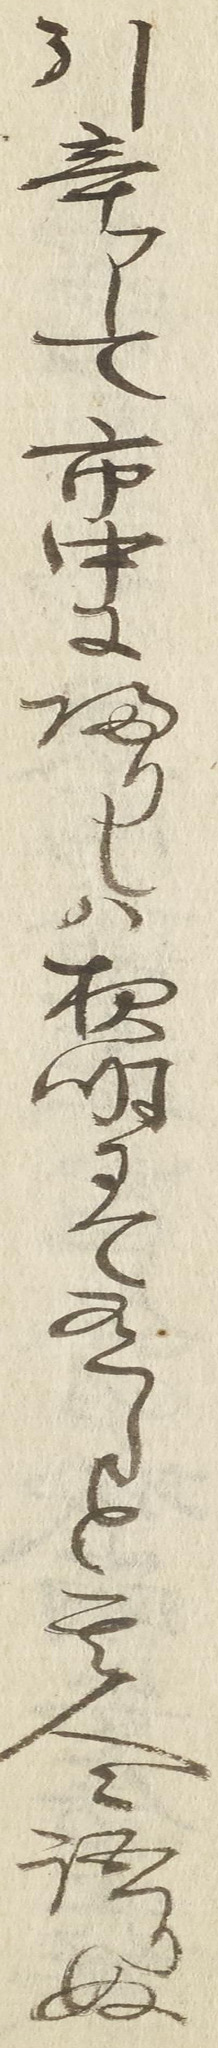引牽ふして市中に帰りしは夜明にて有しと其人に語りぬ
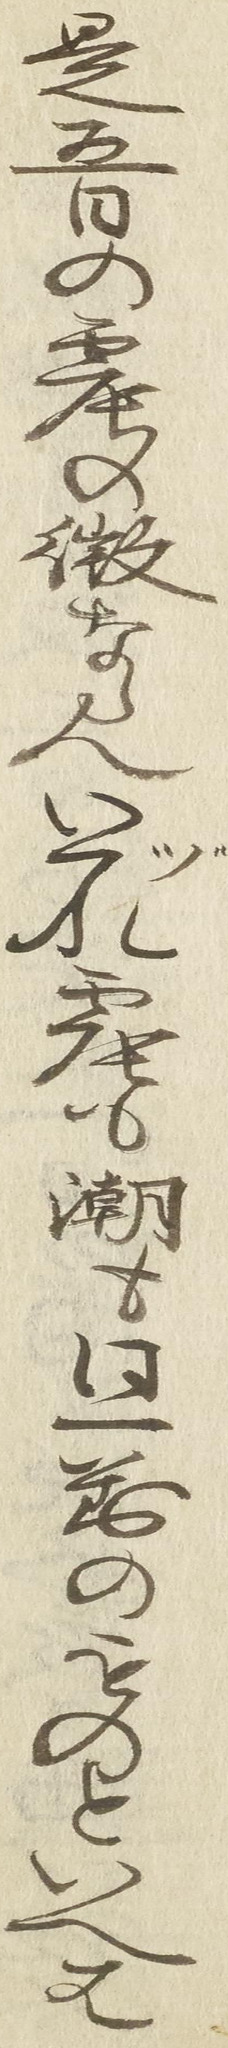是五日の震の徴ならんいつれ震も潮も同一対のものといへは
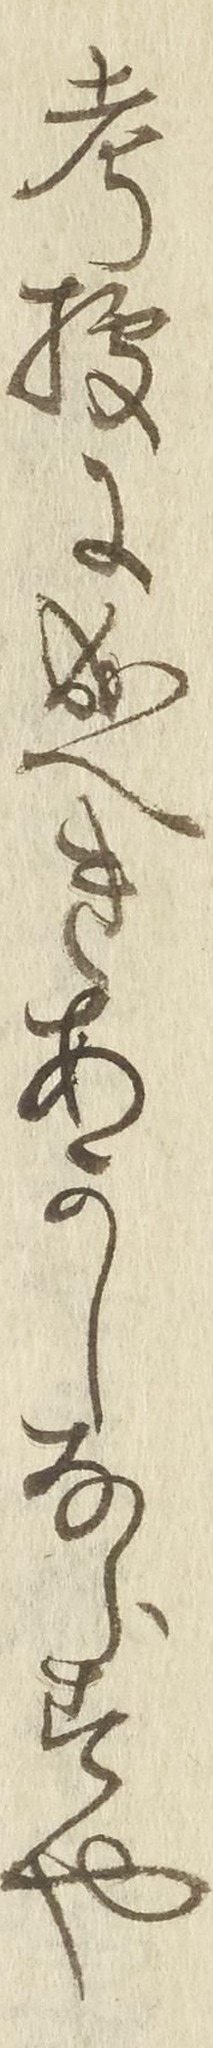考拠に成へきあかしならすや

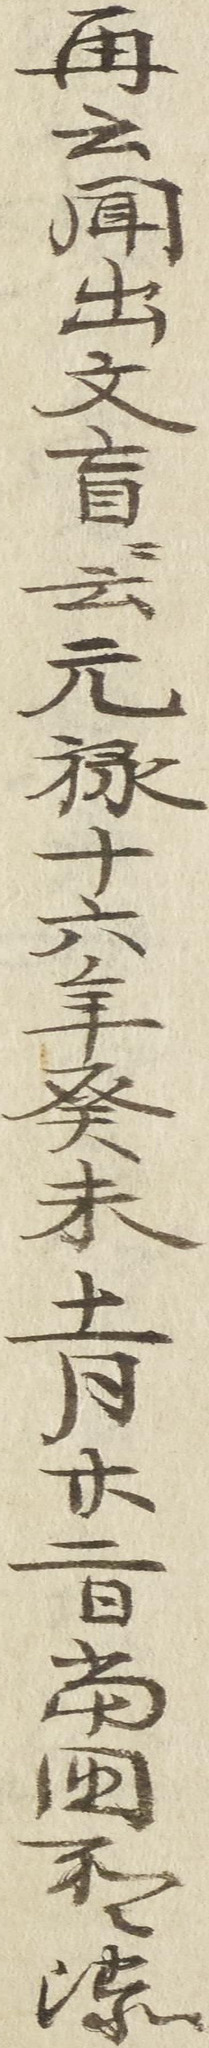再云聞出文盲に云元禄十六年癸未十一月廿二日当国所々湊
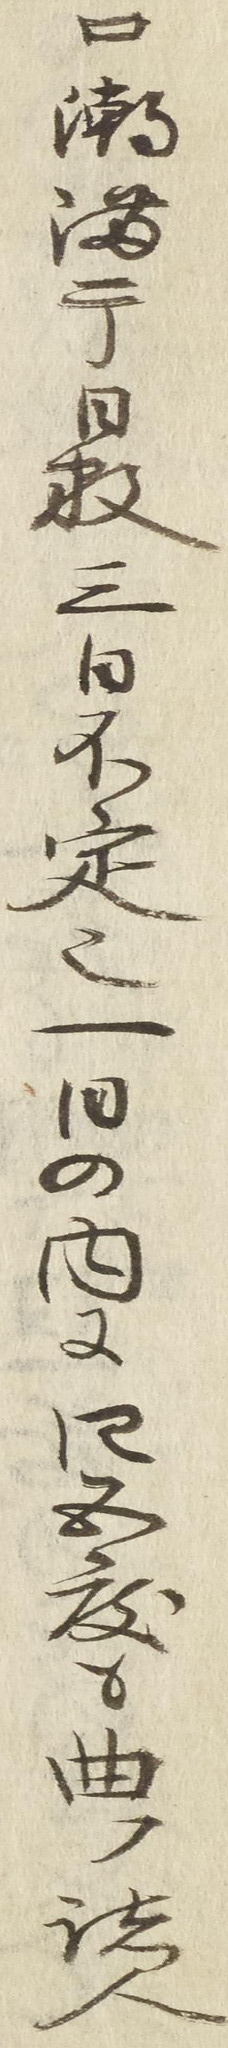口潮満干日数三日不定也一日の内に四五度も曲ふ諸人
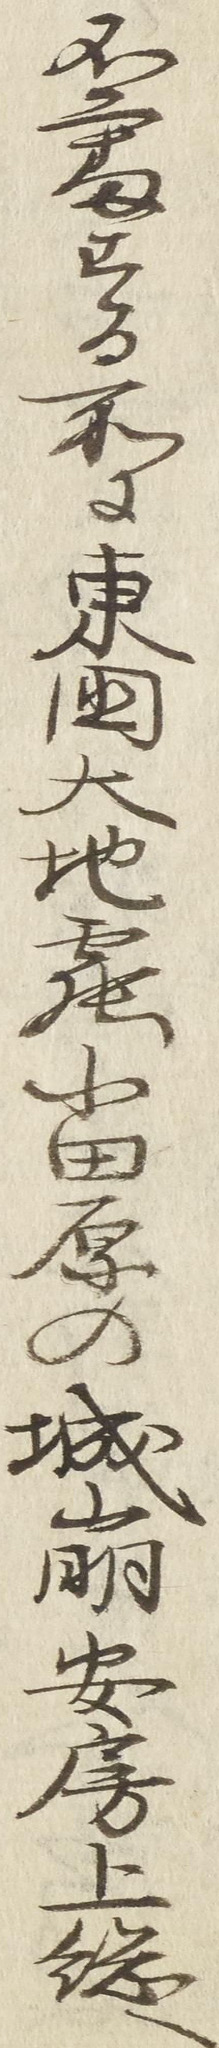不審する所に東国大地震小田原の城崩安房上総へ
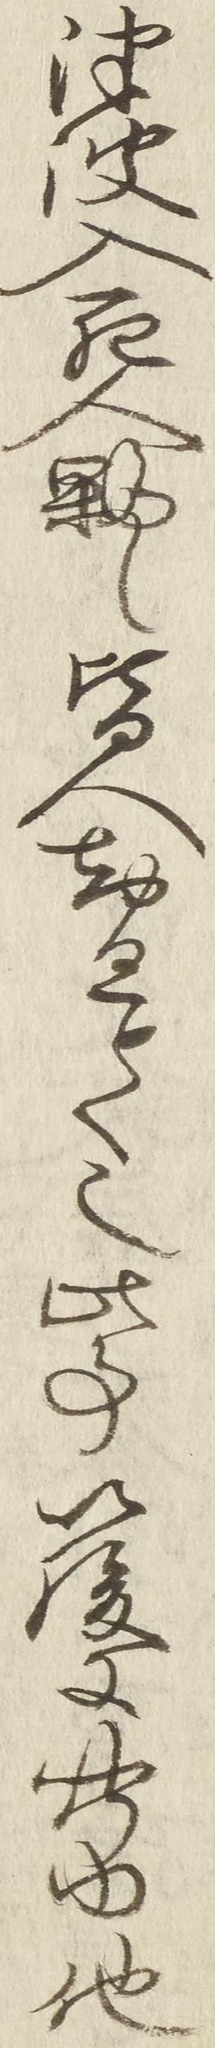津波入死人夥し皆人知ることく也此事以後に聞ゆ他
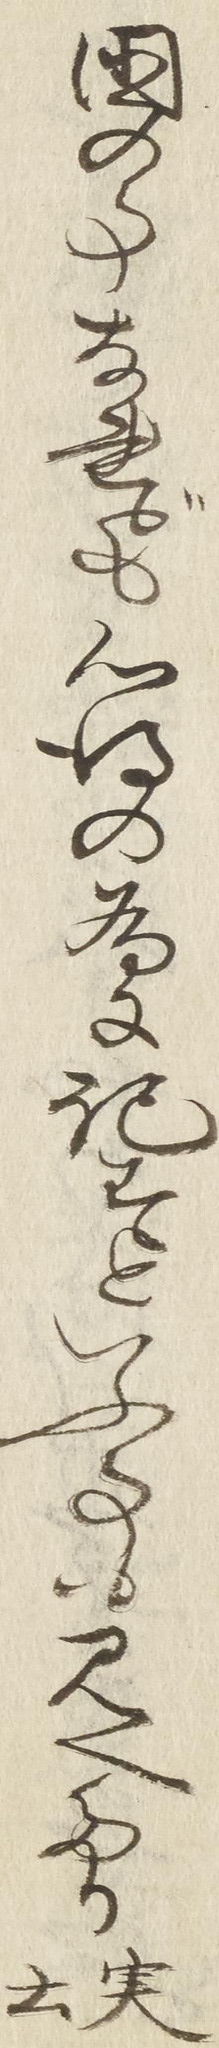国の事なれども心得の為に記すといふ事も見へたり実云
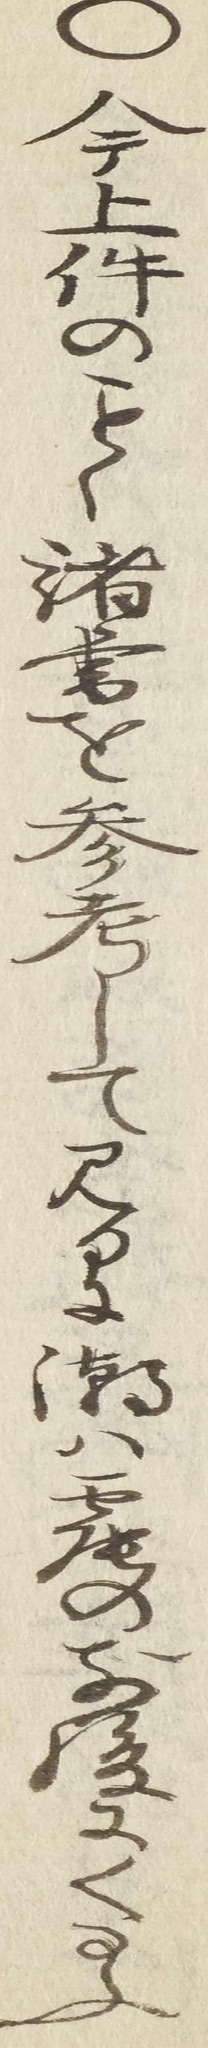〇今上件のことく諸書を参考して見るに潮は震の前後にくるふ
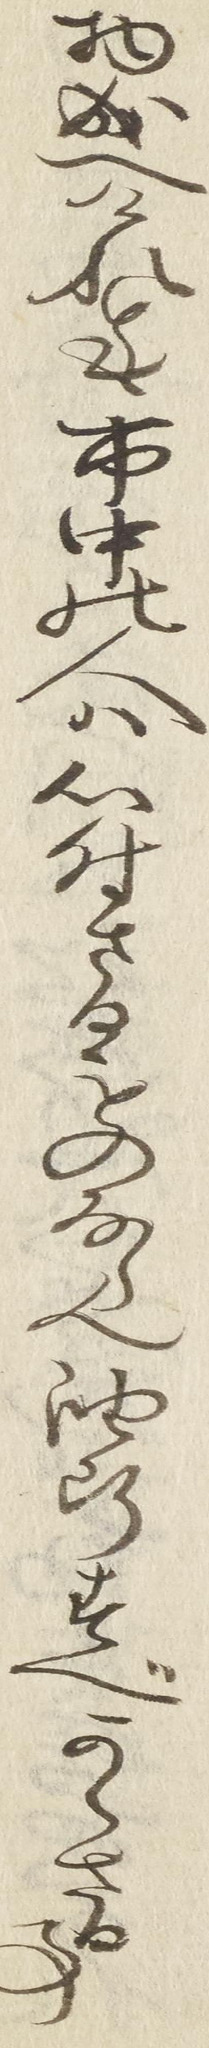物成へけれとも市中の人は心付さるものならん油断すべからさる事
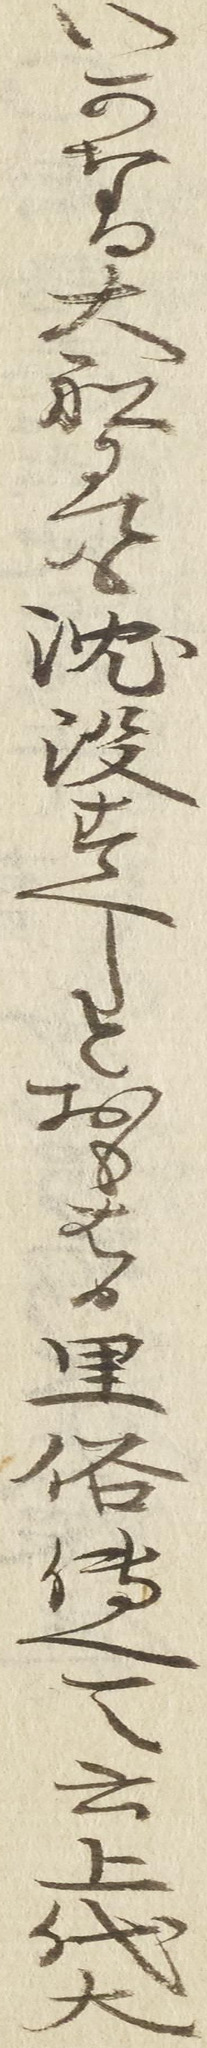いかなる大船にても沈没すへしとおもわる里俗伝へて云上代大
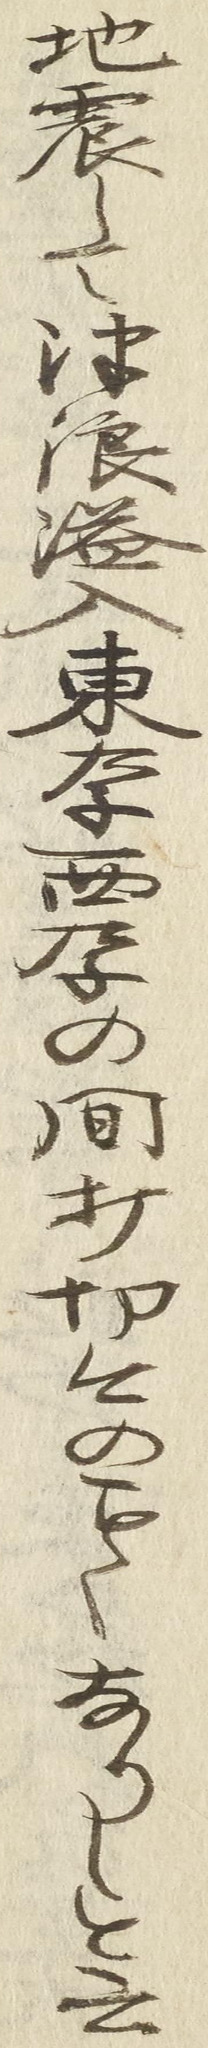地震して津浪溢入東孕西孕の間打切今のことくなりしと云
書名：地震記　上
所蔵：東京大学地震研究所図書室 Earthquake Research Institute Library, The University of Tokyo, JAPAN
